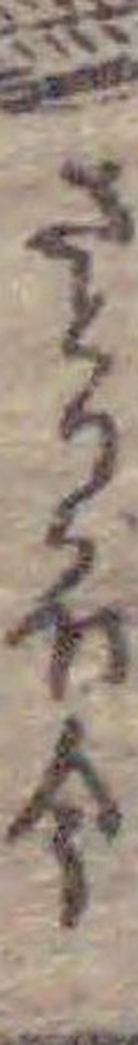さとりがほ今
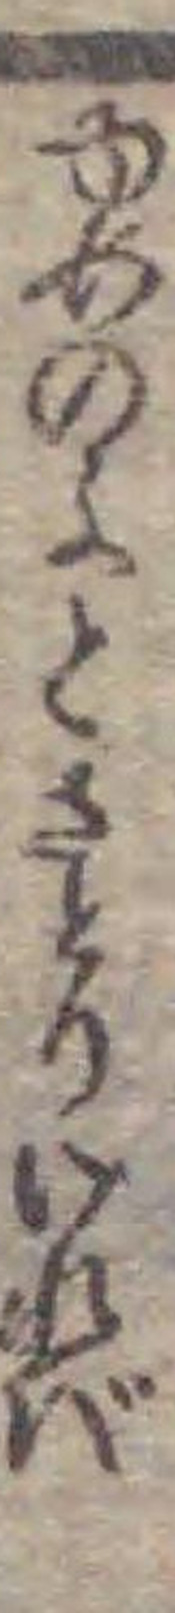ゆめのよとさとりければ
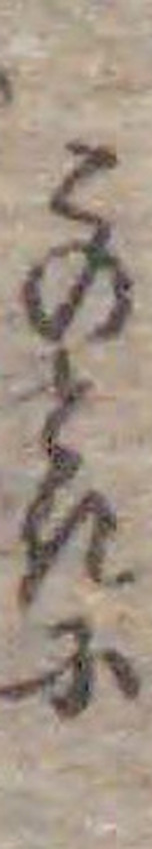このときに
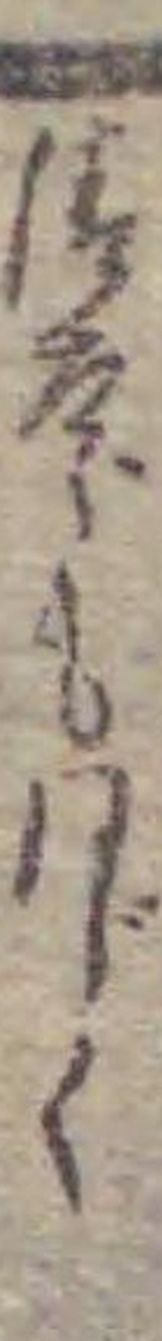清太郎も同じく
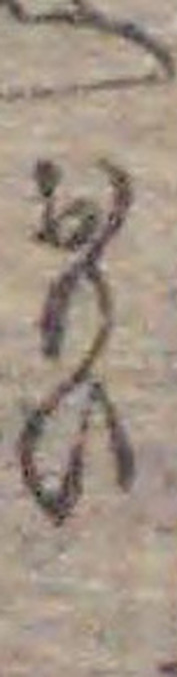おもひ
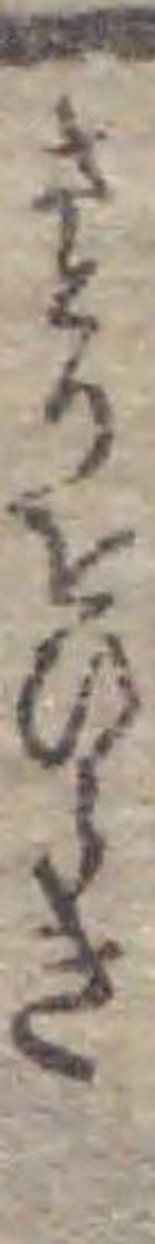さとりをひらき
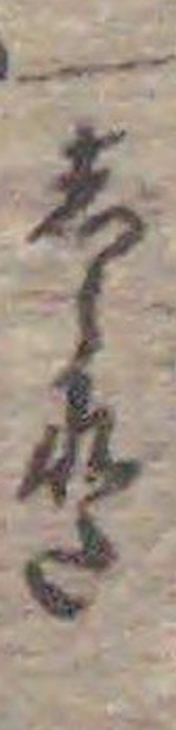しられた
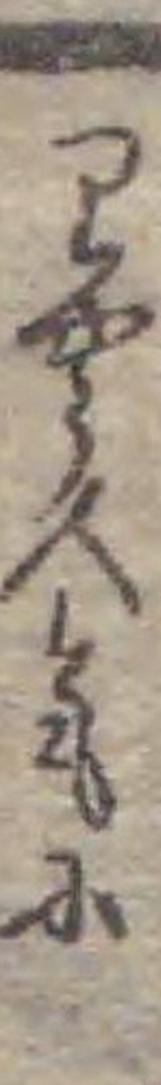りやう人ともに
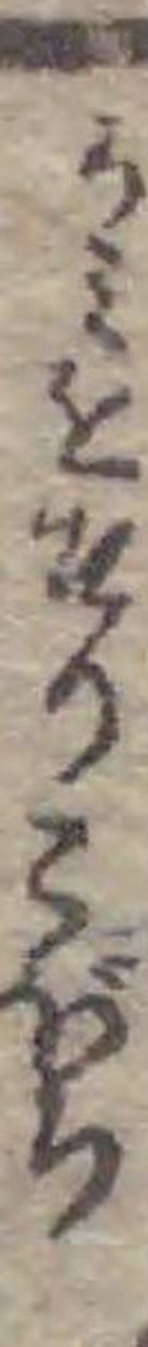かみをそりこぼち
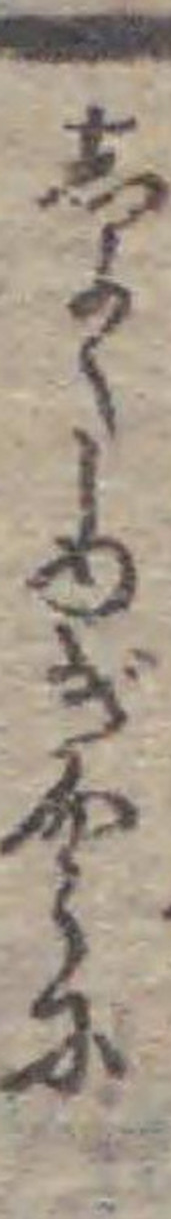しよりしゆぎやうに
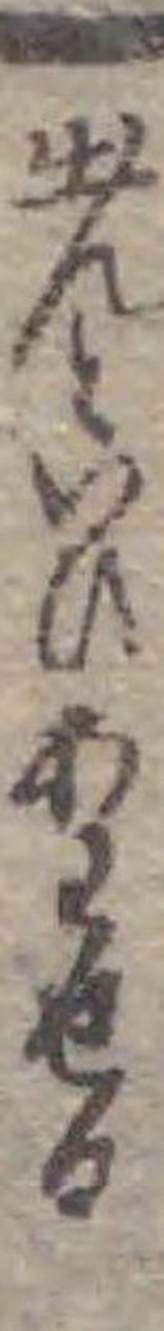出んといひあわせる
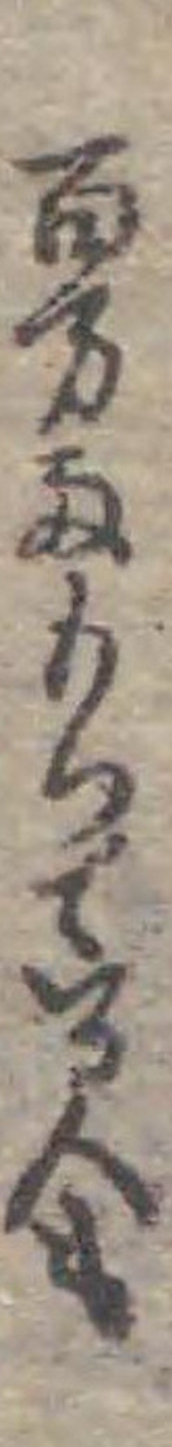百万両もちている人も
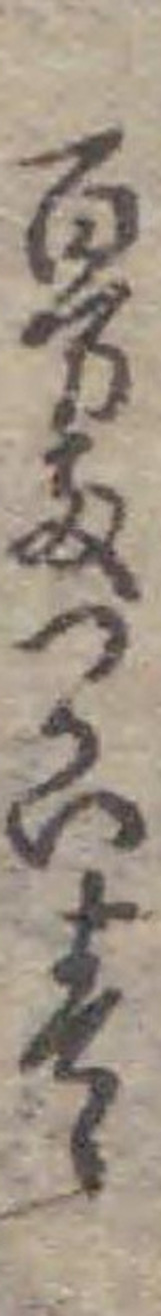百万両つかいすてゝ
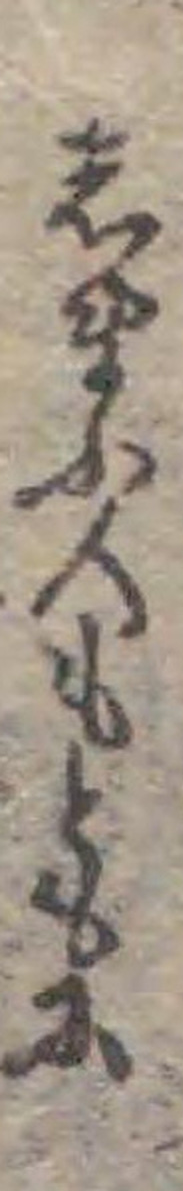しまふ人もともに
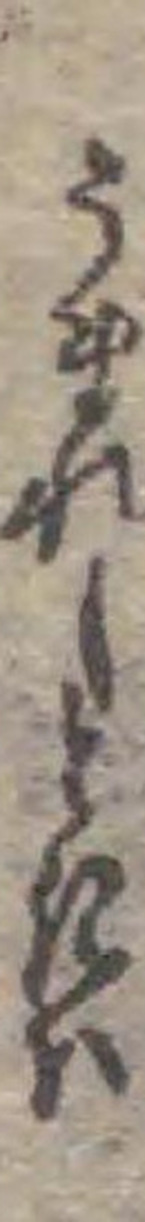うまれしときは
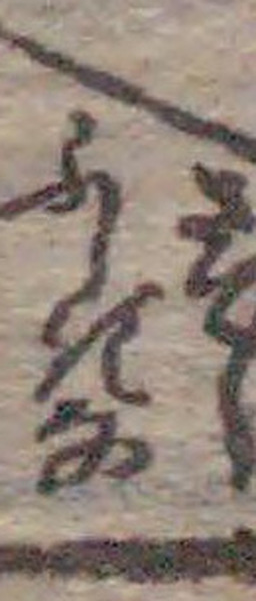ふしきな
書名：見徳一炊夢 : 3巻
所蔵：国立国会図書館 National Diet Library, JAPAN
